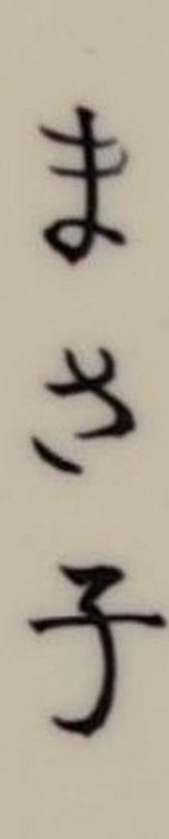まさ子
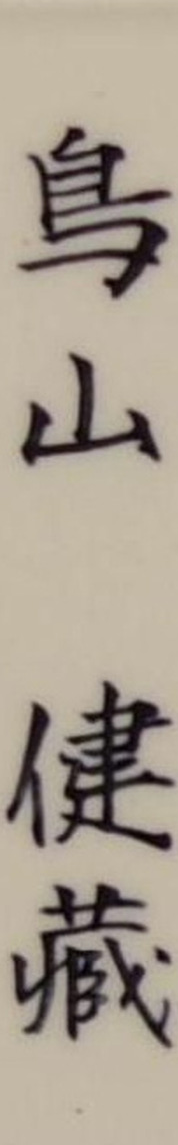鳥山健蔵
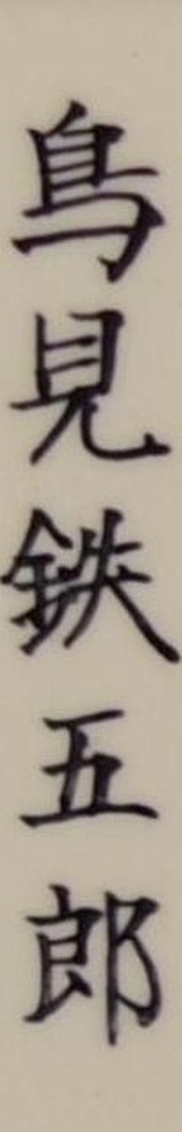鳥見鉄五郎
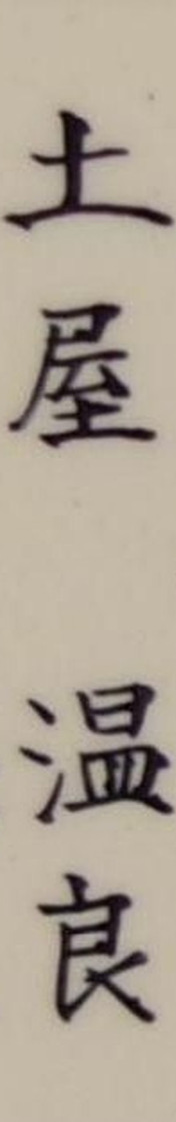土屋温良

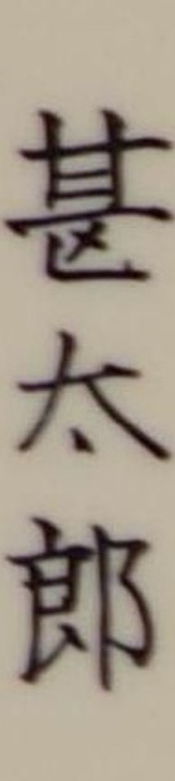甚太郎
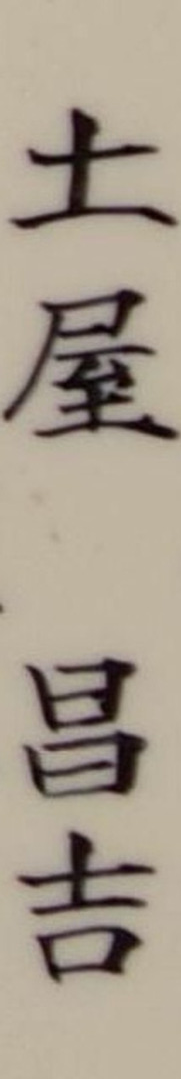土屋昌吉
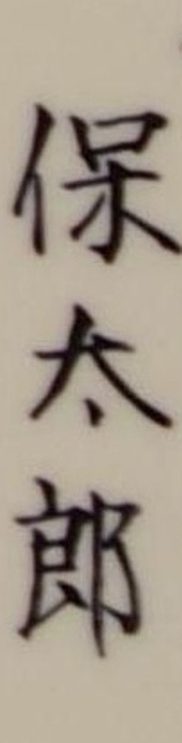保太郎
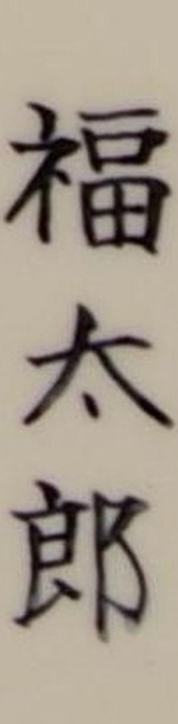福太郎
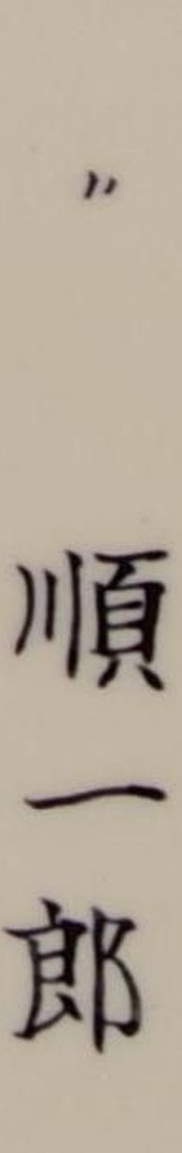順一郎
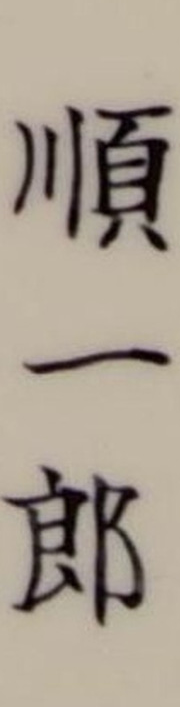順一郎
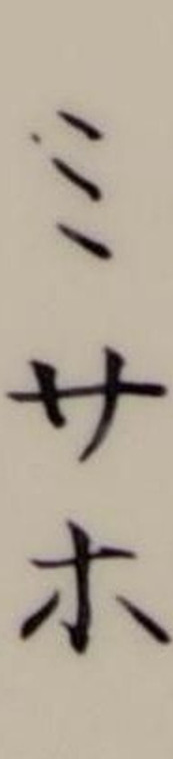ミサホ
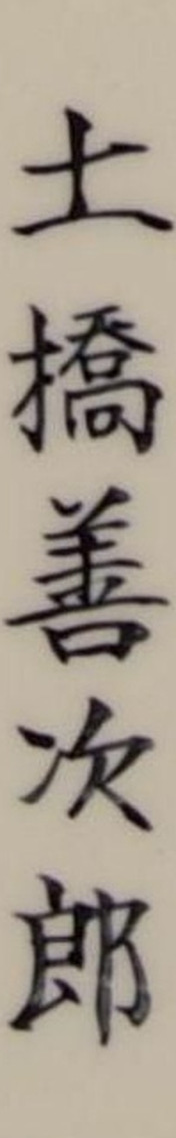土橋善次郎
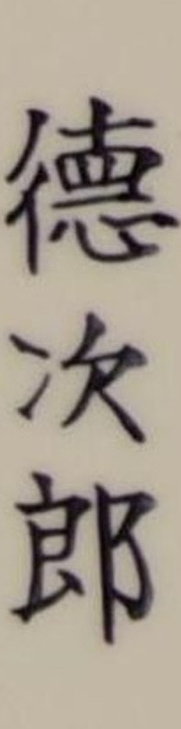徳次郎
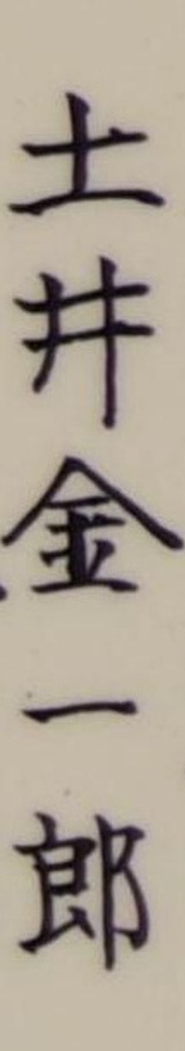土井金一郎
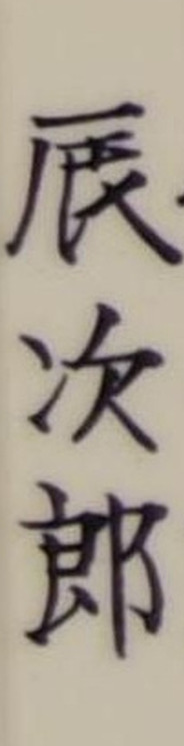辰次郎

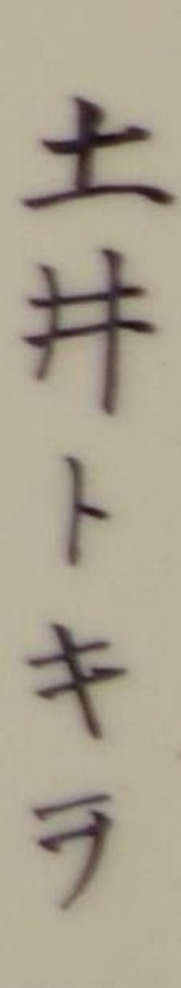土井トキヲ
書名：M~S
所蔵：高野山金剛峯寺
